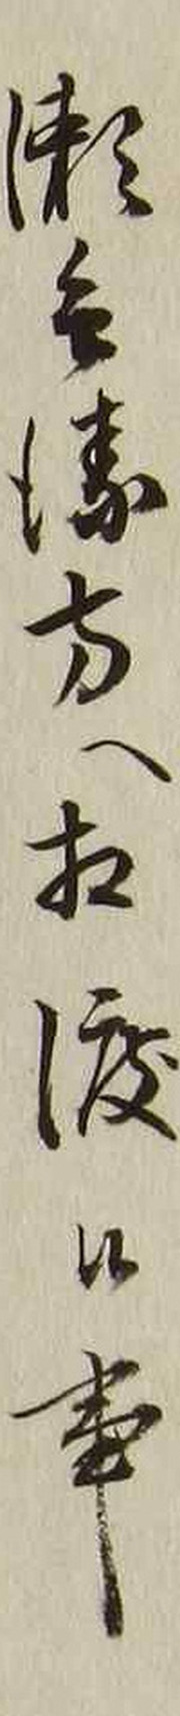瀬兵衛方へ相渡し候事
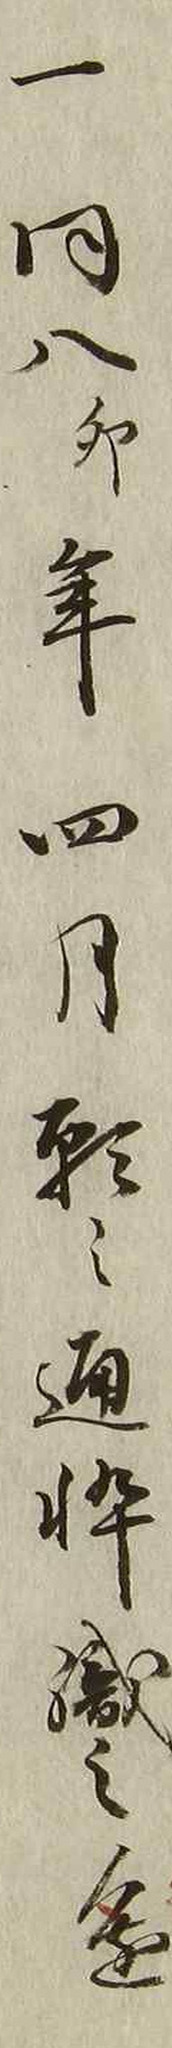一同八卯年四月願い之通り倅織之進
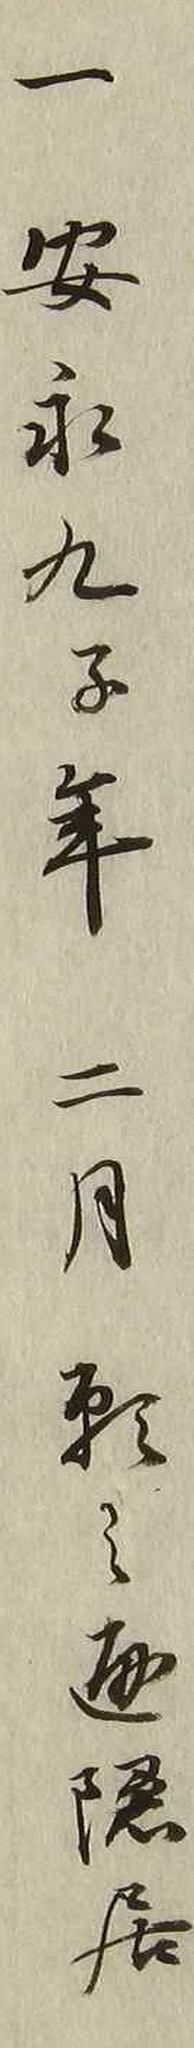一安永九子年二月願い之通り隠居
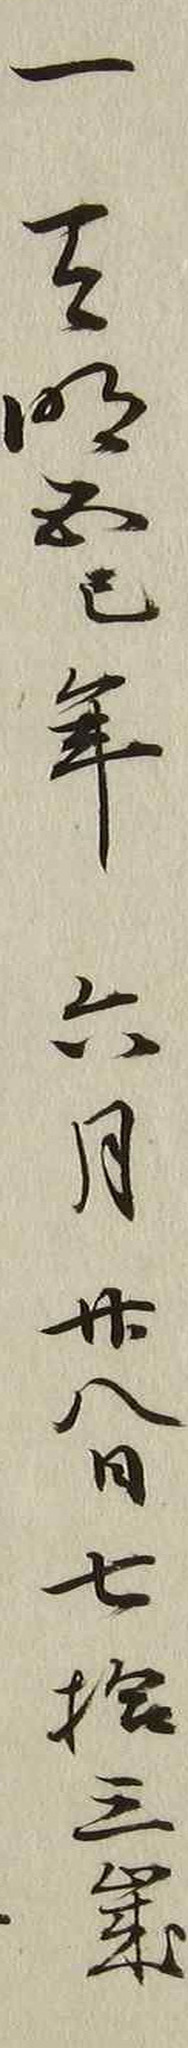一天明五巳年六月廿八日七拾三歳
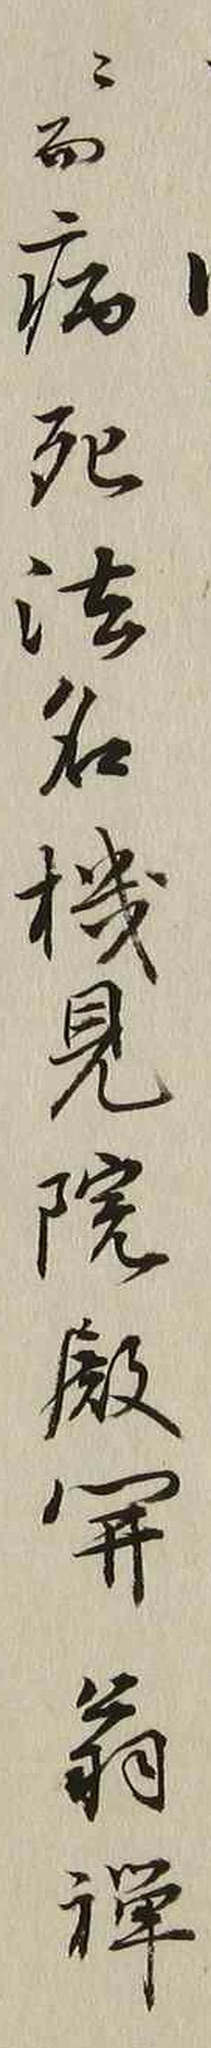ニて病死法名機見院殿開翁禅
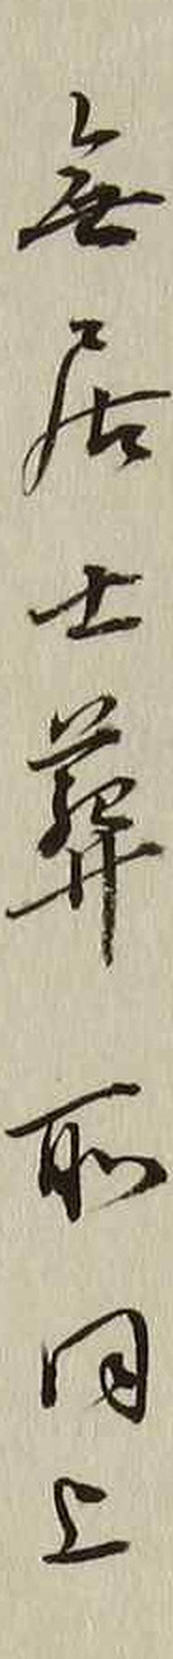無居士葬所同上
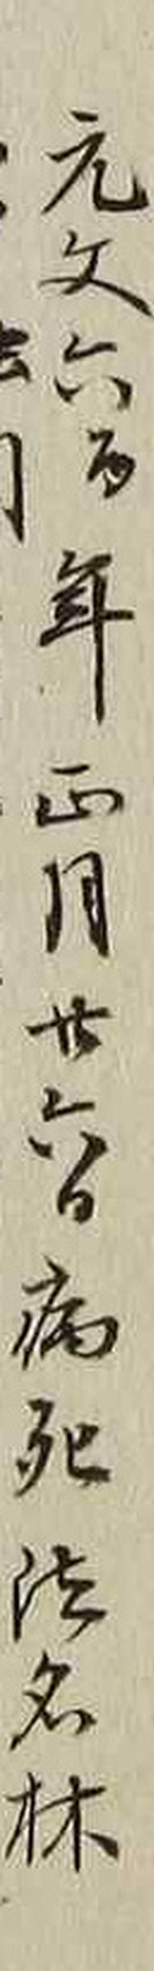傳治元文六酉年正月廿六日病死法名林
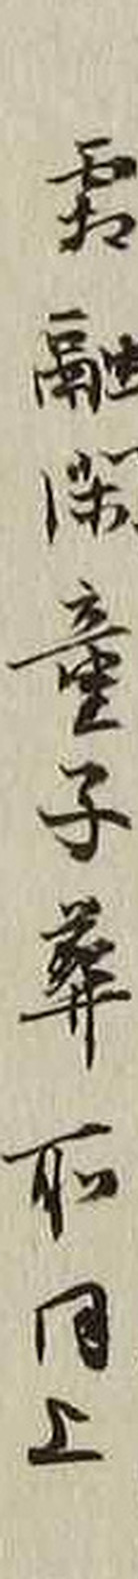霜融閑童子葬所同上
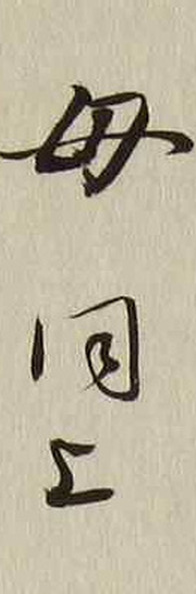母同上
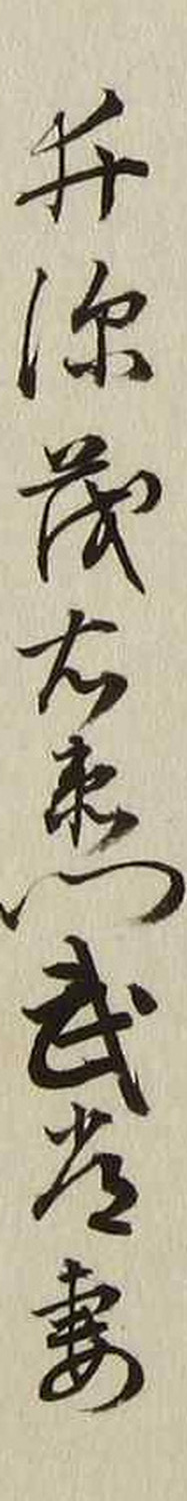女井深茂右衛門武常妻
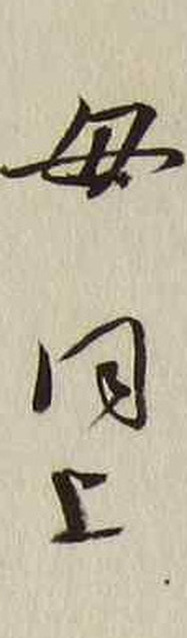母同上

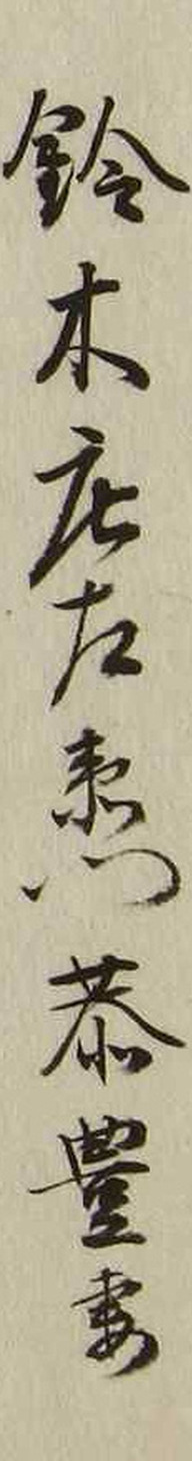女鈴木庄左衛門恭豊妻
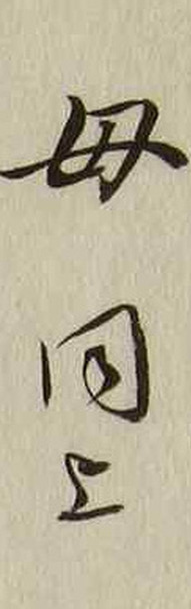母同上
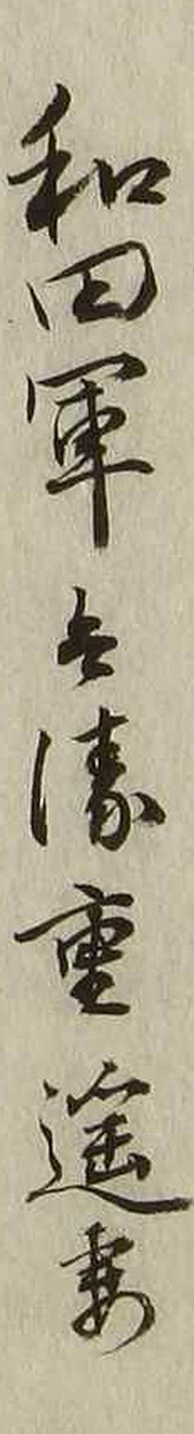女和田兵衛重遥妻
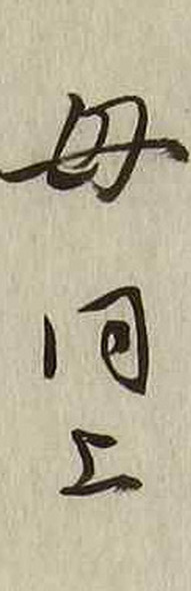母同上
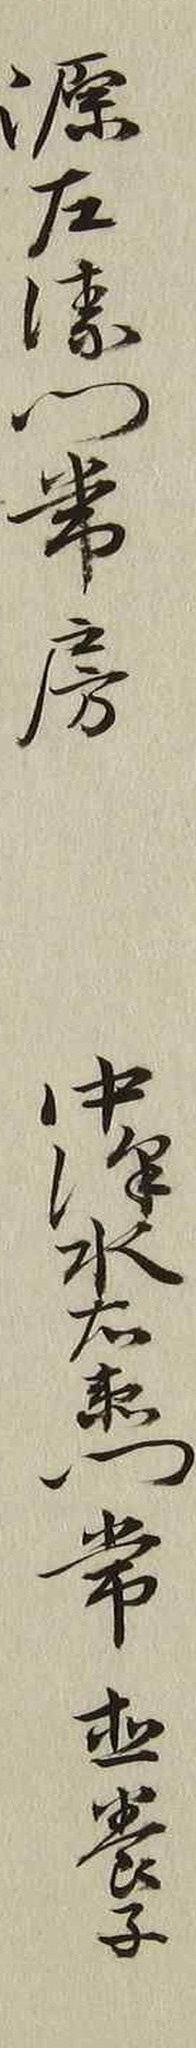源左衛門常房中津水右衛常直養子
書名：諸士系譜　巻之16　い之部16
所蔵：会津若松市立会津図書館
